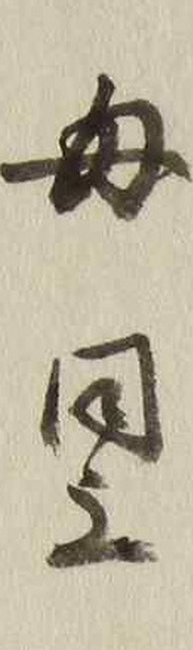母同上
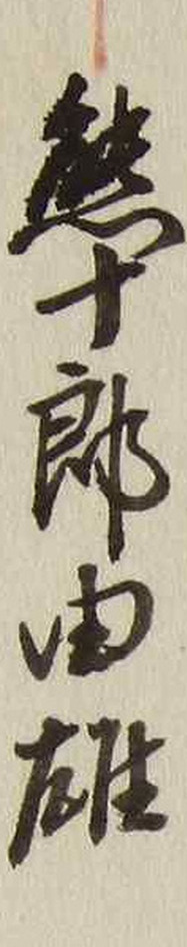熊十郎由雄
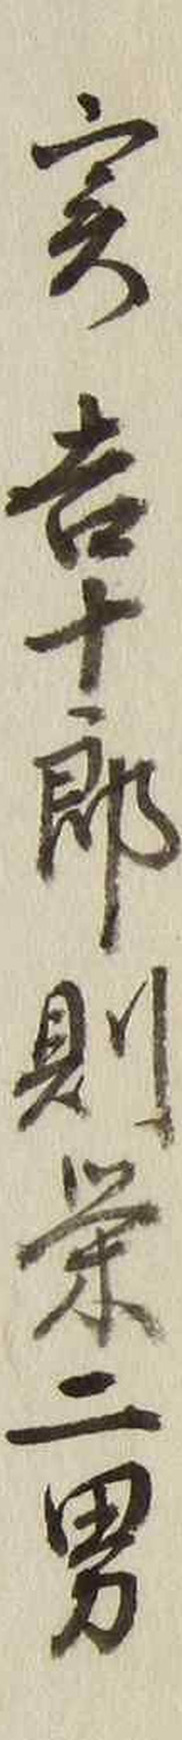実吉十郎則栄二男

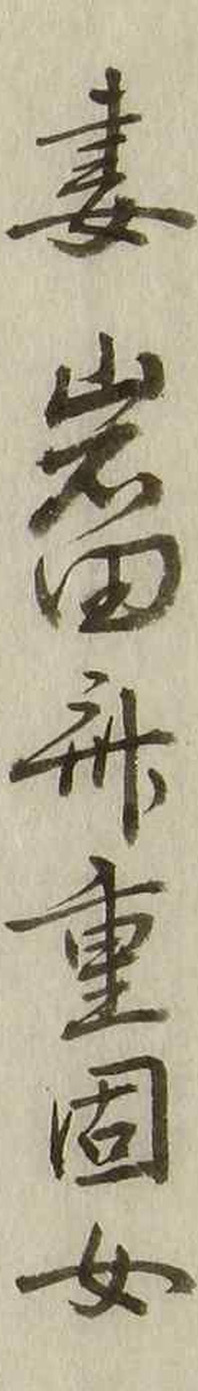妻岩田斎重固女
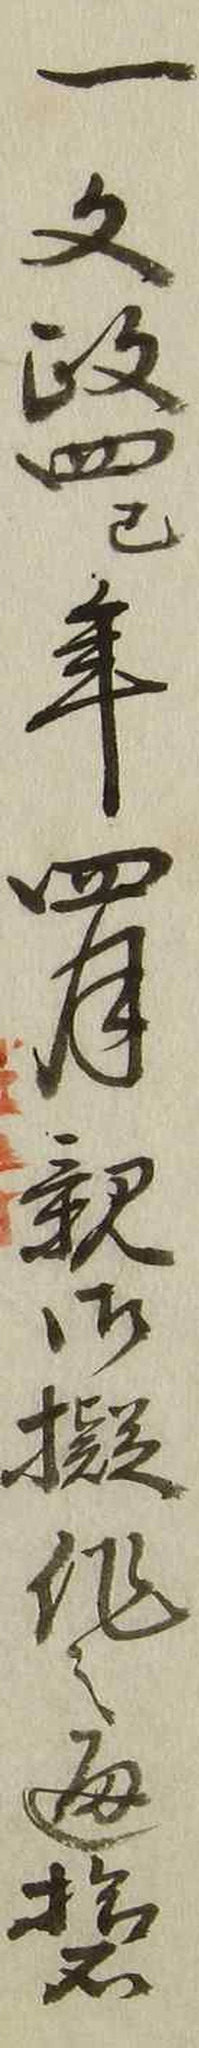一文政四巳四月親擬作之通拾石
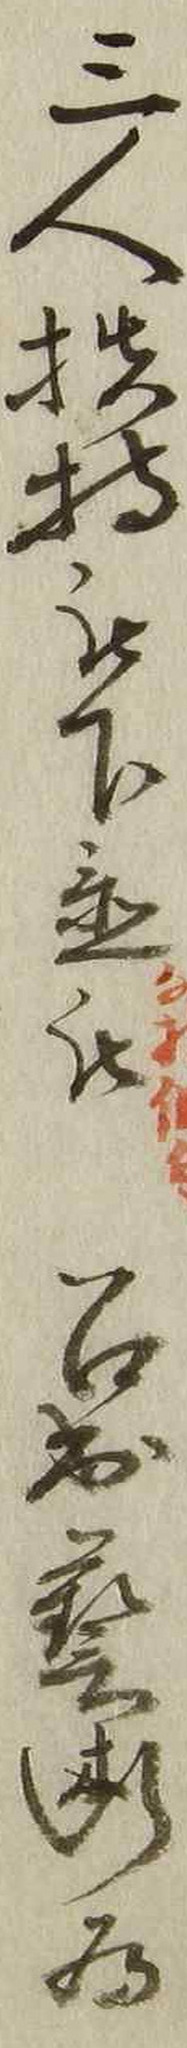三人扶持被下置被召出芸術為
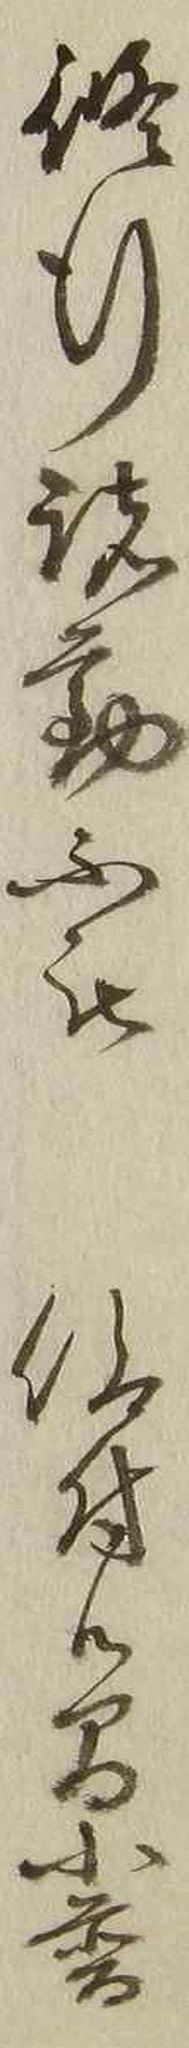修業諸勤不被仰付候間小普
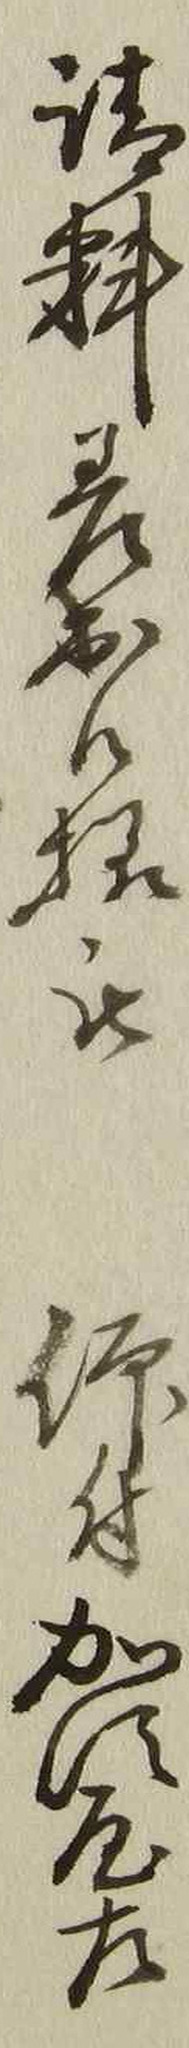請料差出候様被仰付加須屋左
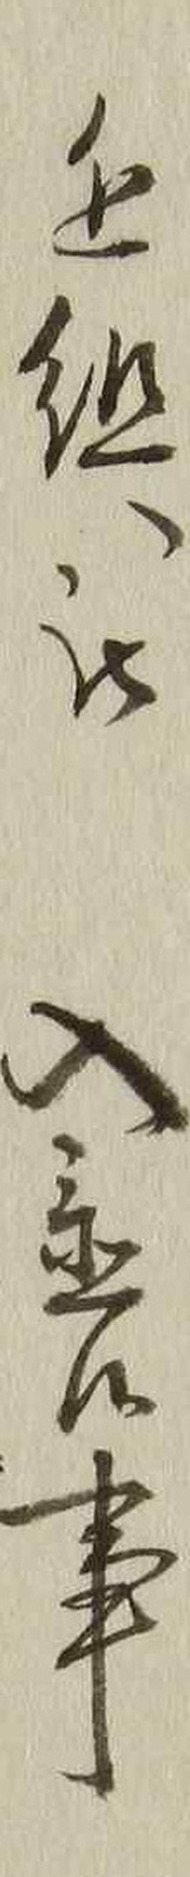近組へ被入置候事
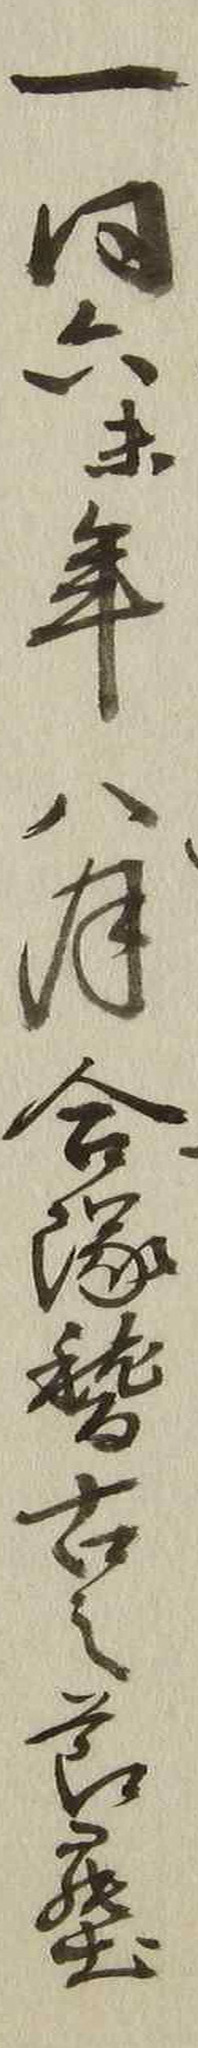一同六未年八月合隊稽古之節罷出
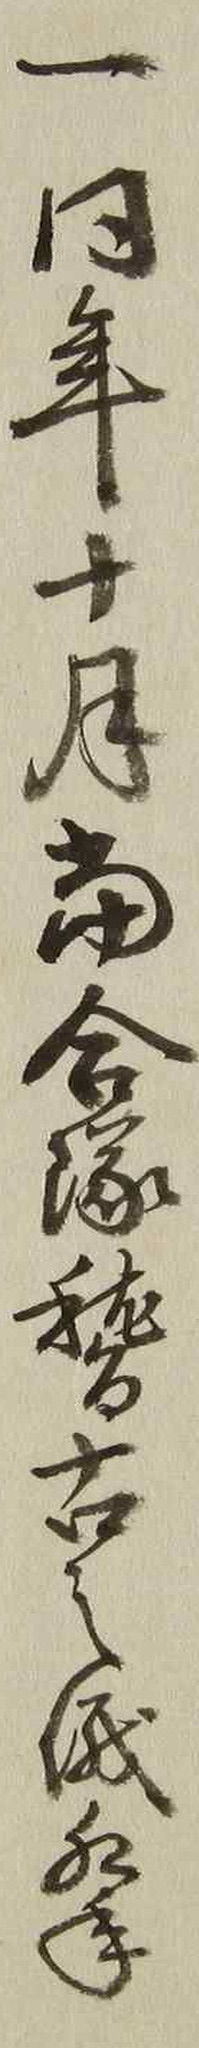一同年十月当合隊稽古之儀卯年
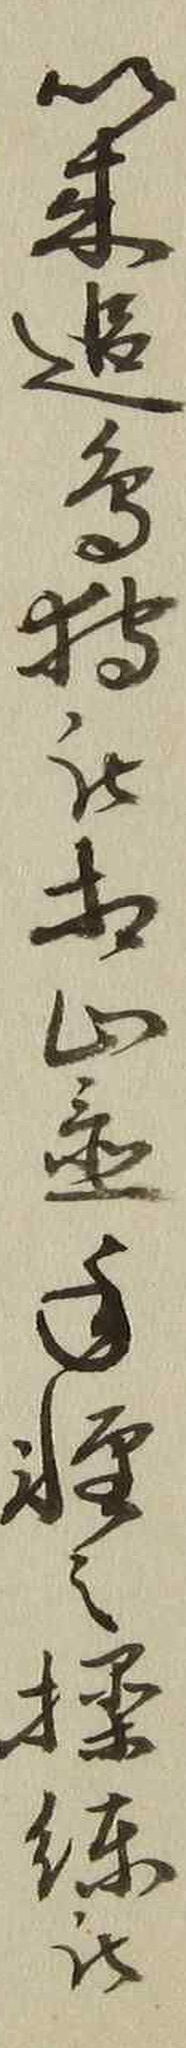以来追鳥狩被相止置手軽之操練被
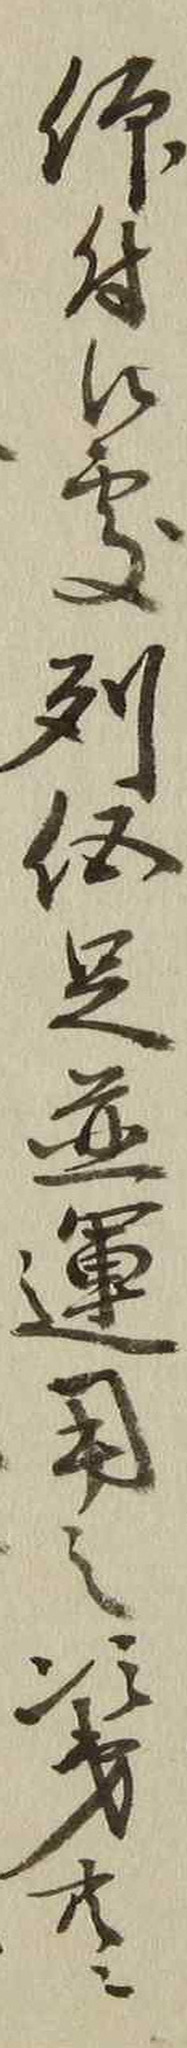仰付候処列伍足並運用之次第共ニ
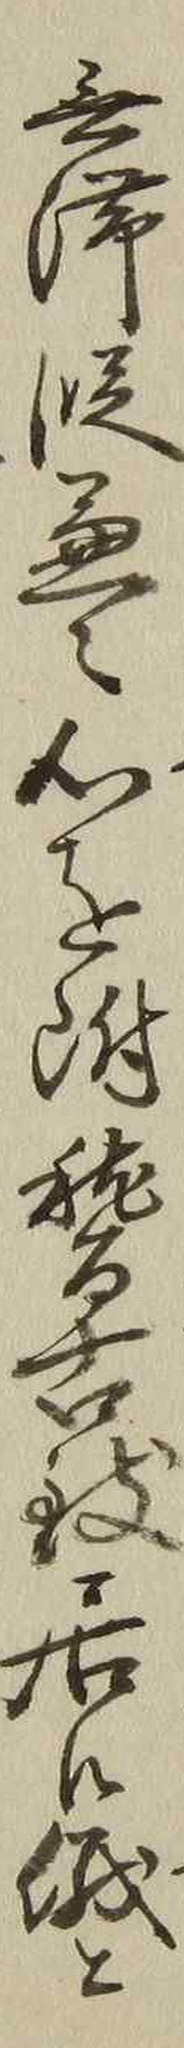無滞段兼々心を附稽古致居候儀と
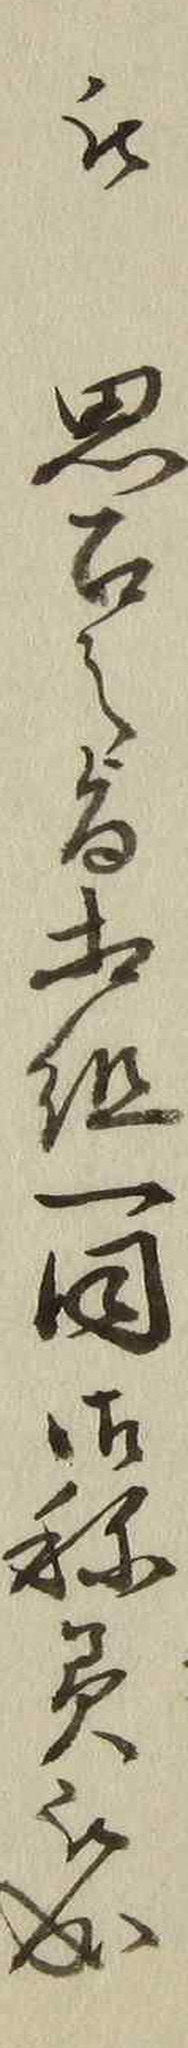被思召之旨相組一同御称美被成
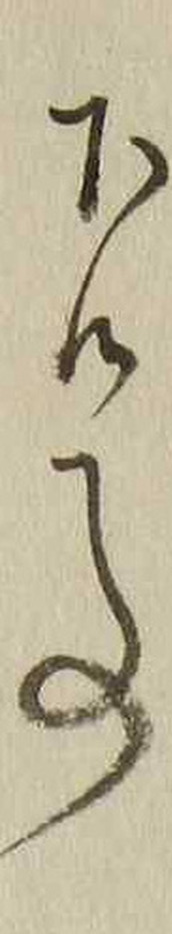下候事
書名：諸士系譜　巻之31　い之部31
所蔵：会津若松市立会津図書館
